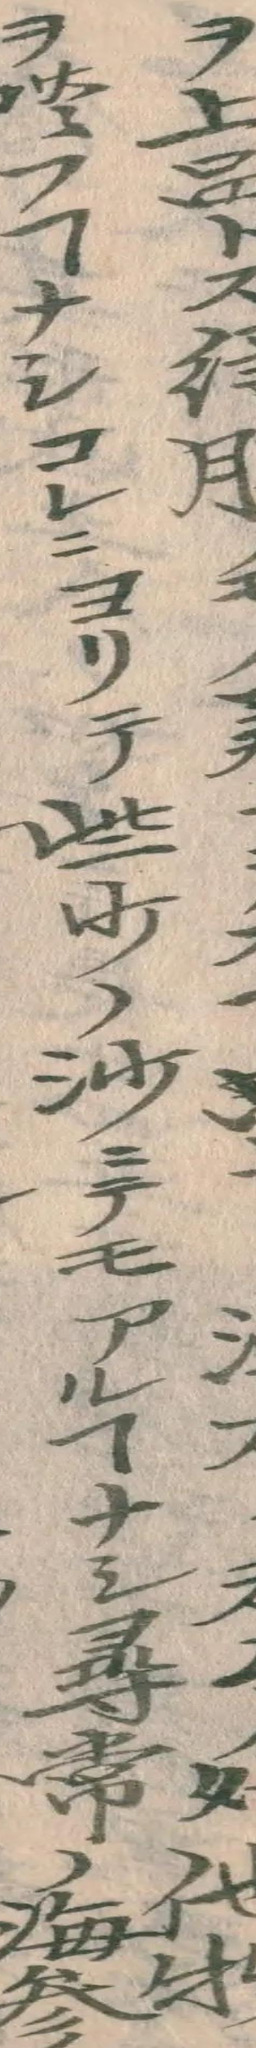ヲ啖フコトナシコレニヨリテ些少ノ沙ニテモアルコトナシ尋常ノ海参
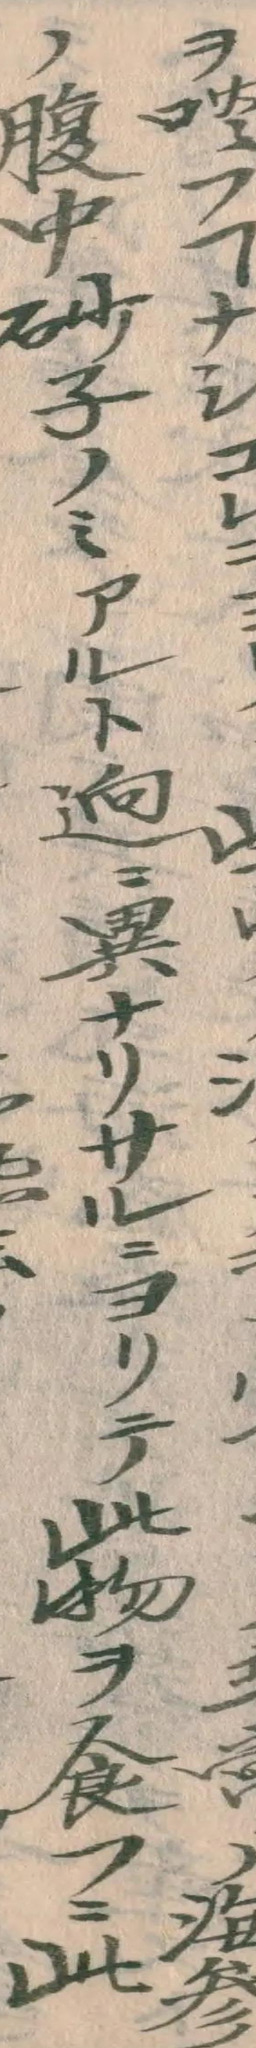ノ腹中砂子ノミアルト逈ニ異ナリサルニヨリテ此物ヲ食フニ此
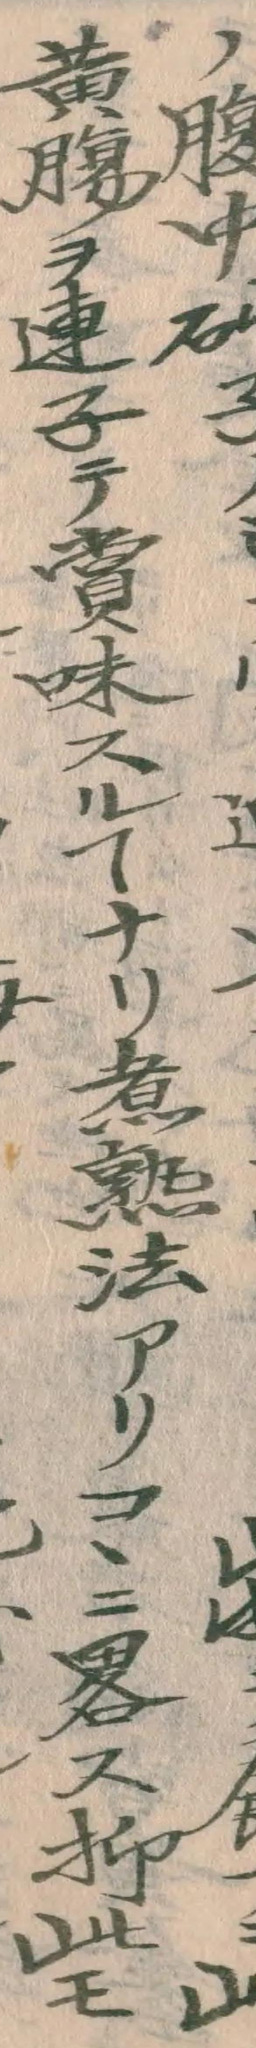黄腸ヲ連ネテ賞味スルコトナリ煮熟法アリコヽニ畧ス抑此モ
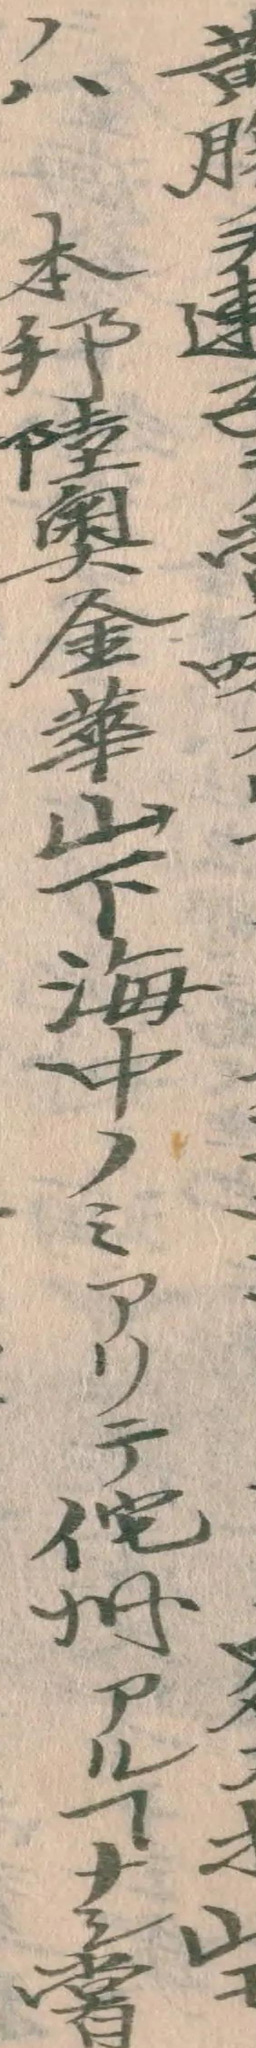ノハ本邦陸奥金華山下海中ノミアリテ侘州アルコトナシ嘗
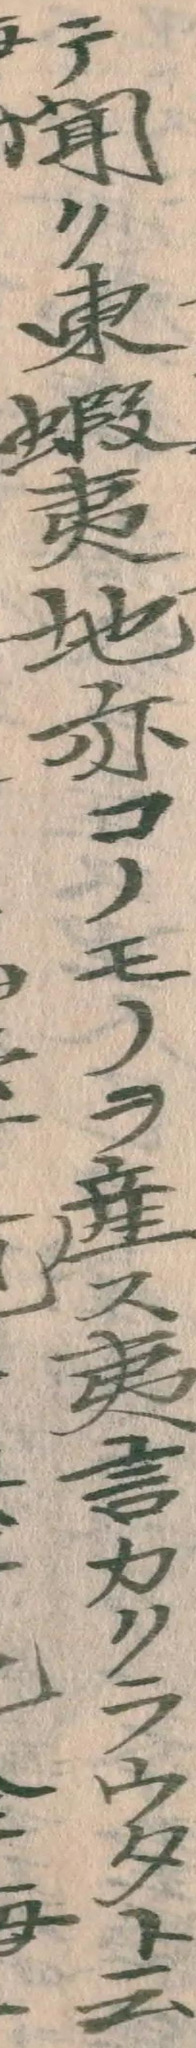テ聞ク東蝦夷地亦コノモノヲ産ス夷言カクラウタト云
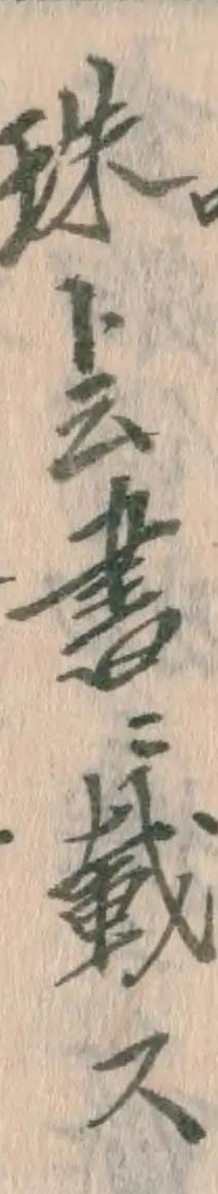珠ト云書ニ載ス
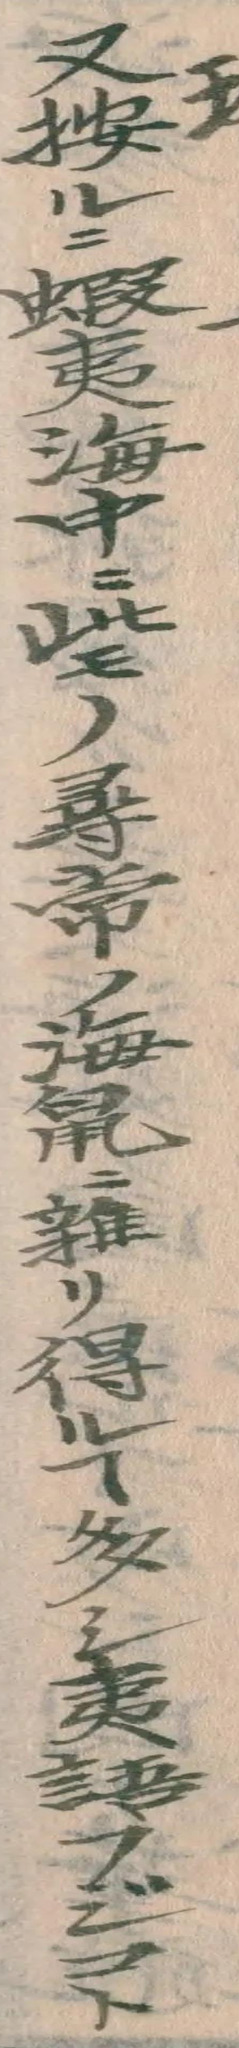又按ルニ蝦夷海中ニ此モノ尋常の海鼠ニ雑リ得ルコト多シ夷語フジコト
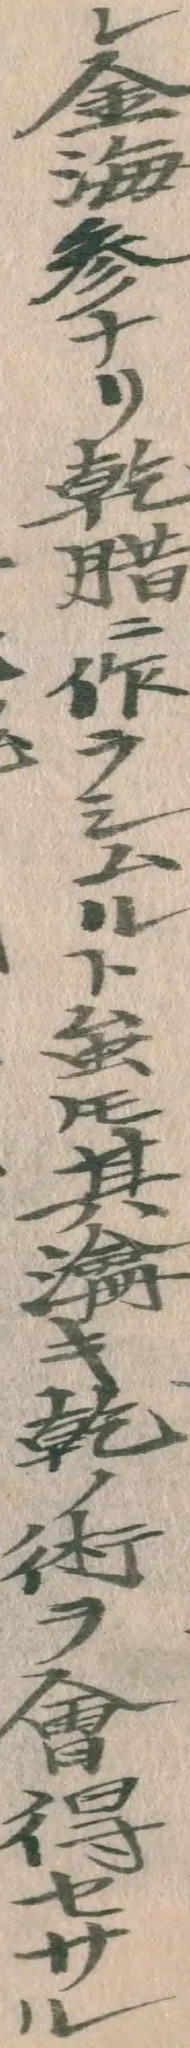レ金海参ナリ乾腊ニ作ラシムルト𧈧トモ其瀹キ乾ノ術ヲ会得セサル
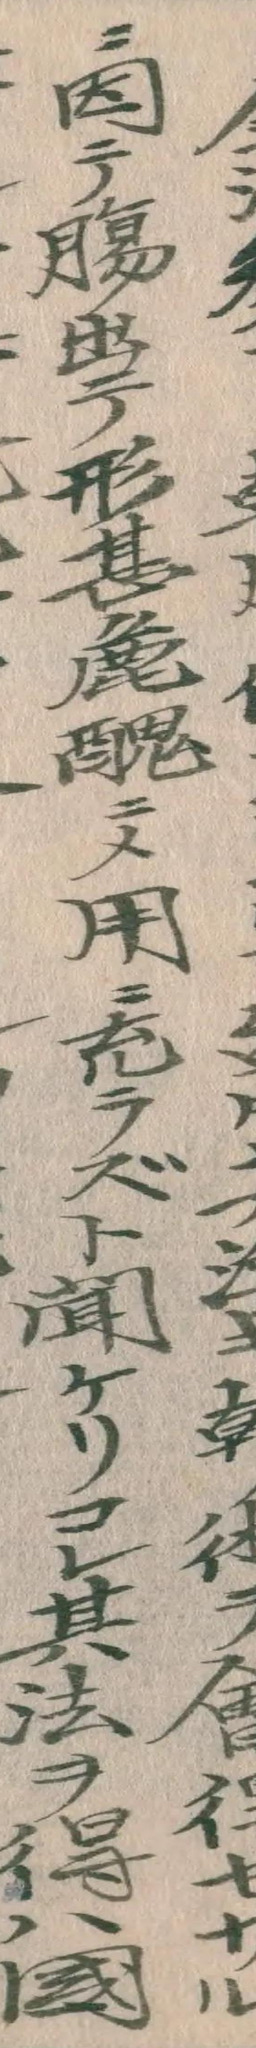ニ因テ腸出テ形甚麁醜ニシテ用ニ充ラズト聞ケリコレ其法ヲ得ハ国
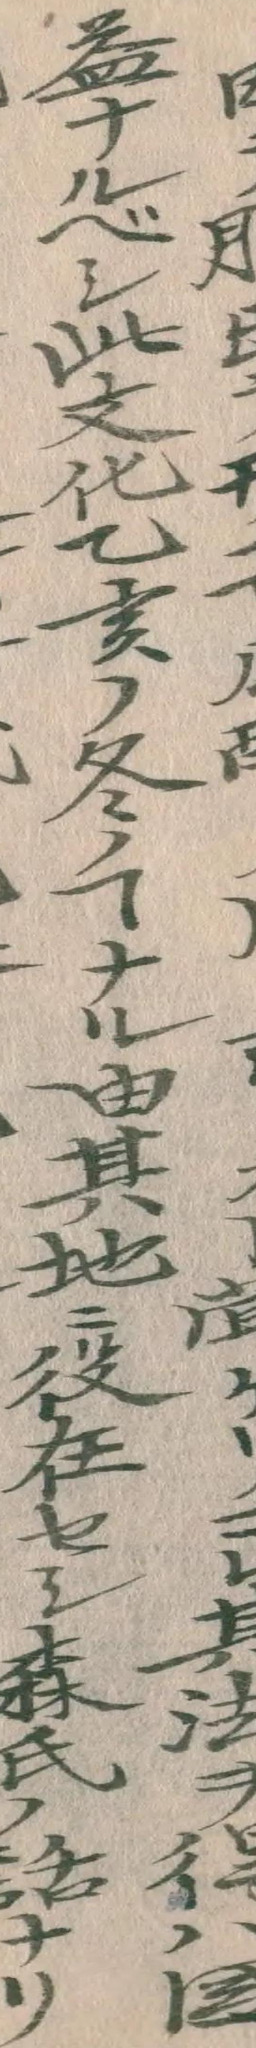益ナルベシ此文化乙亥ノ冬ノコトナル由其地ニ役在セシ森氏ノ話ナリ
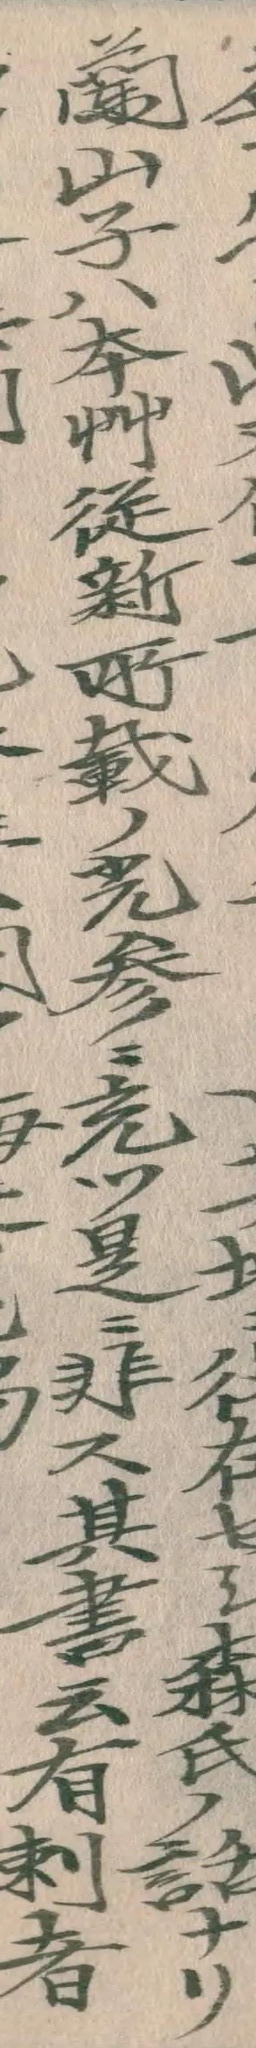蘭山子ハ本草従新所載ノ光参ニ充ツ是ニ非ス其書云有刺者
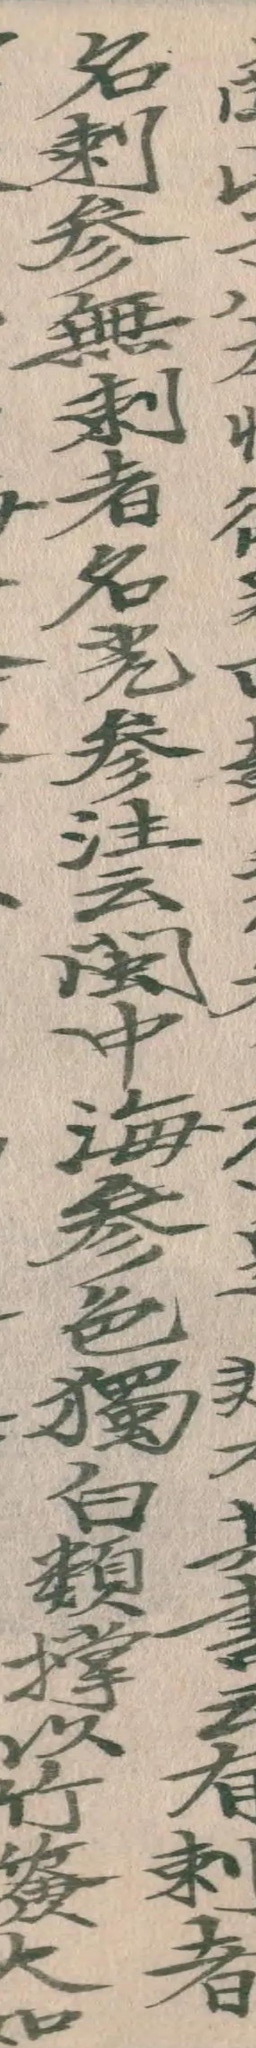名刺参無刺者名光参注云閩中海参色独白類撑以竹簽大如
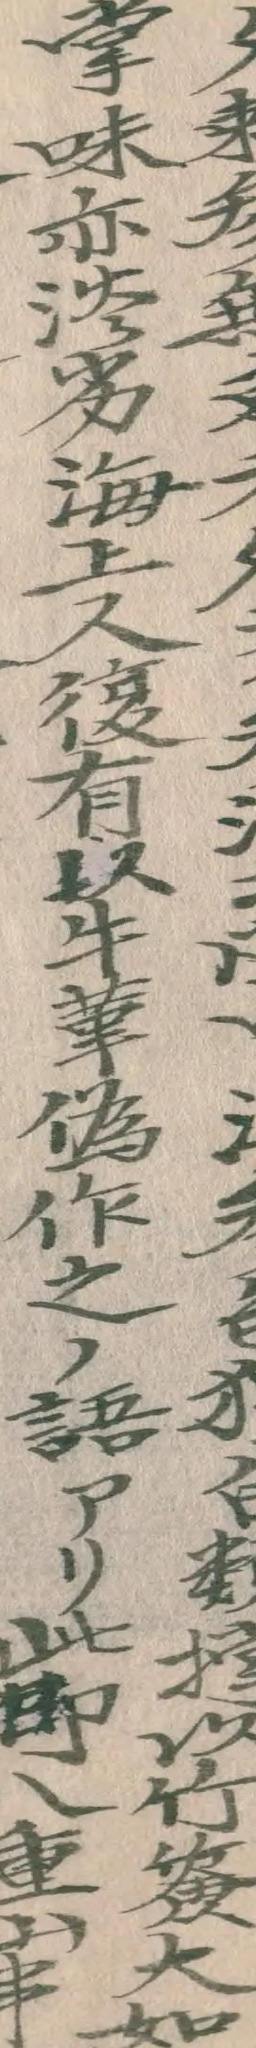掌味亦淡劣海上人復有以牛革偽作之ノ語アリ此即八重山串
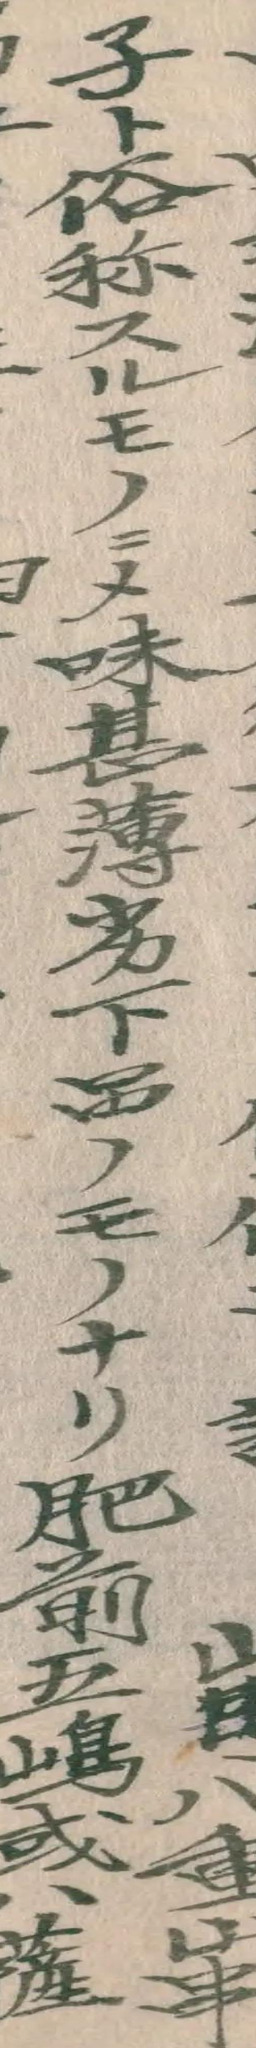子ト俗称スルモノニシテ味甚薄劣下品ノモノナリ肥前五嶋或ハ薩
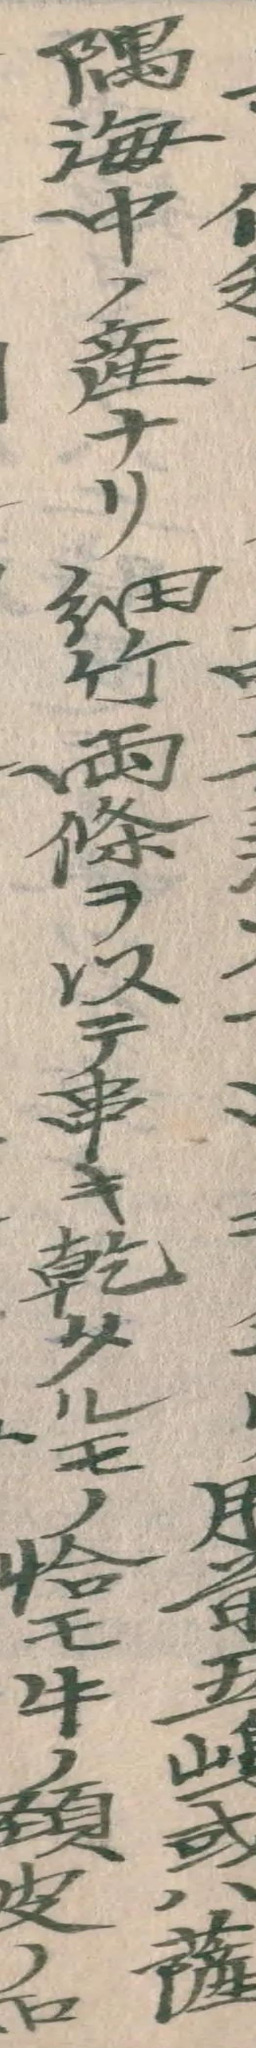隅海中ノ産ナリ細竹両條ヲ以テ串キ乾タルモノ恰モ牛のノ頸皮ノ如
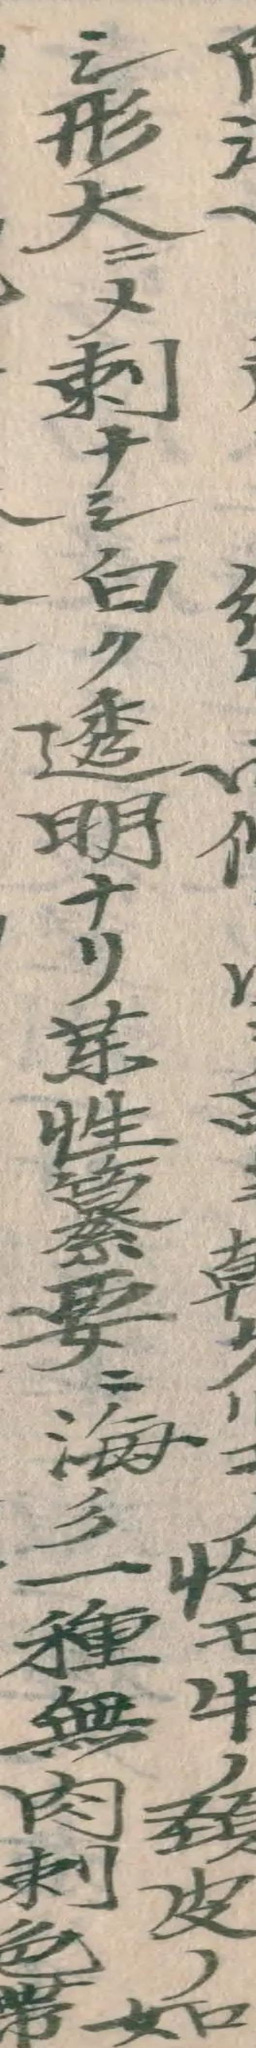シ形大ニシテ刺ナシ白ク透明ナリ薬性纂要ニ海彡一種無肉刺色帯
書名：千蟲譜 3巻. [3]
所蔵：国立国会図書館 National Diet Library, JAPAN
